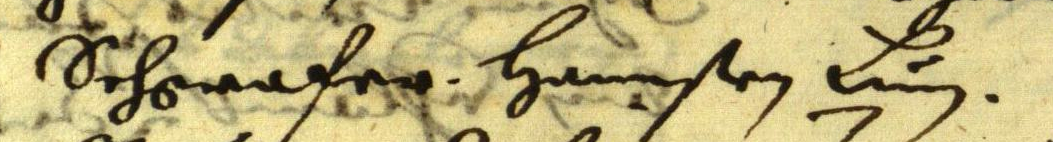Schgrafer. Hansen Lūn.
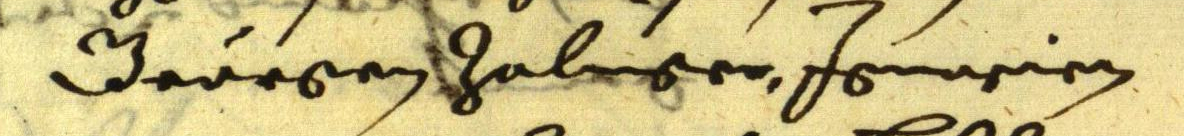Geörgen Zalinger. Ignacien
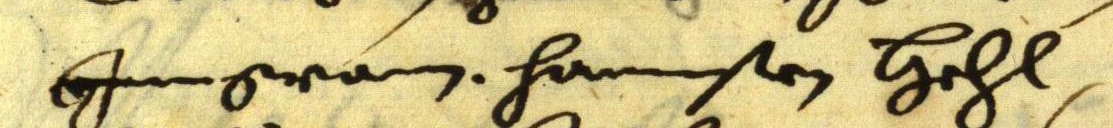Inngram. hannsen Hehl,
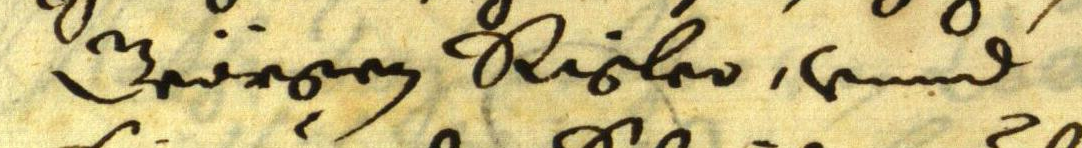Geörgen Rigler, vnnd
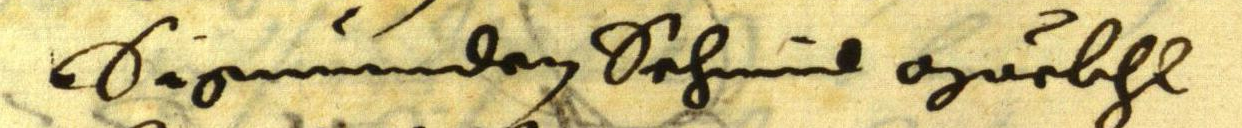Sigmūnden Schmid Māckhl
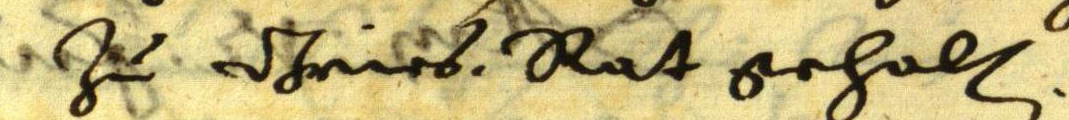Zū Gries. Rat gehalt.
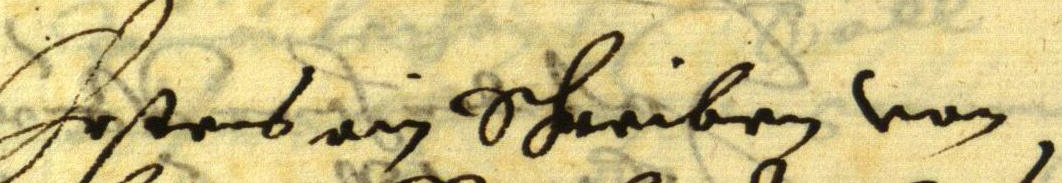Erstens ain Schreiben von
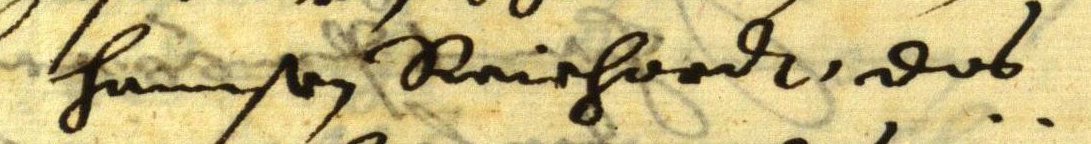hannsen Reichardt, das
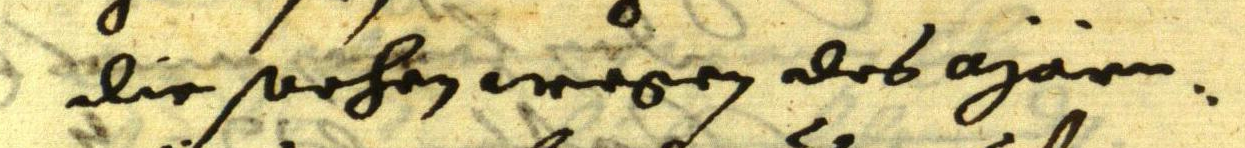die sachen wegen des Märn-
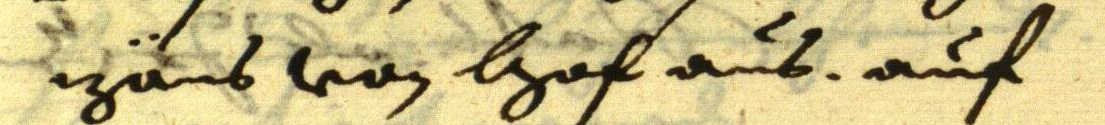zäns von Hof aūs. aūf
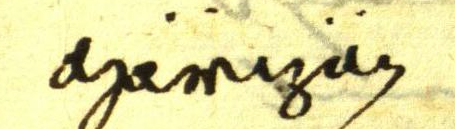Märzän
